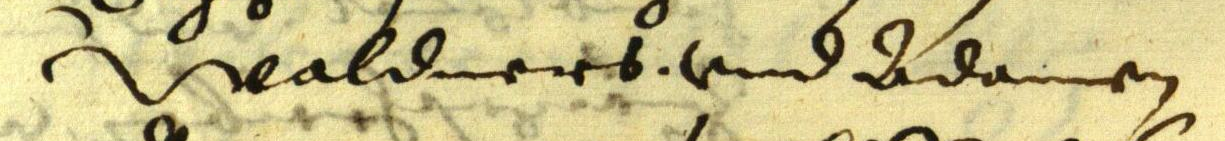Waldners. vnd Adamen
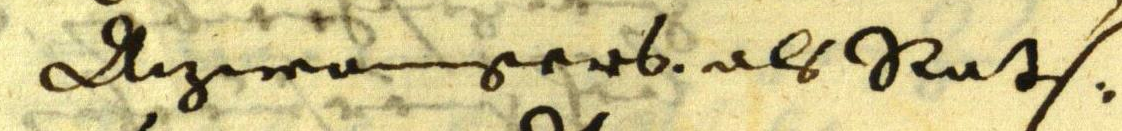Azwanngers. als Rats¬
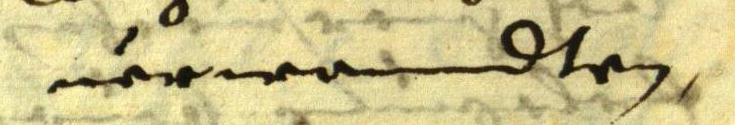ūerwanndten,
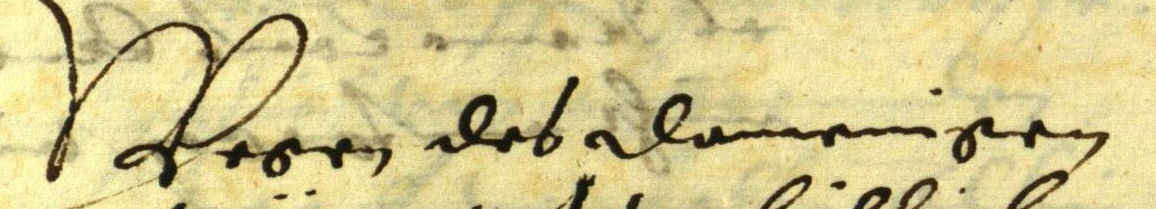Wegen des Domenigen
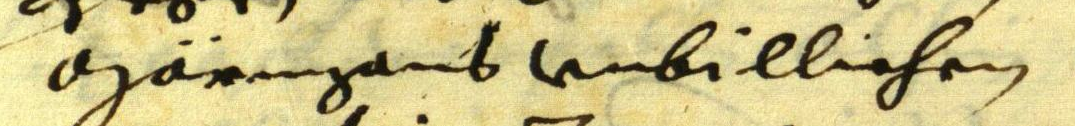Märnzans vnbillichen
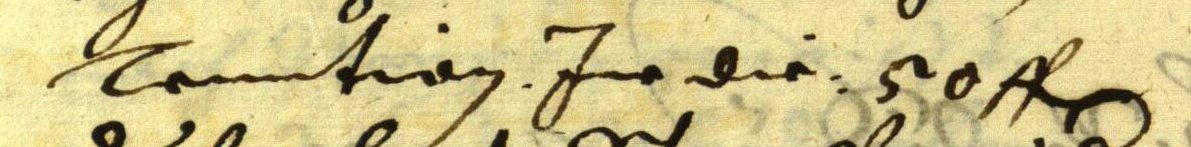Tenntion. Ine die: 50 fl
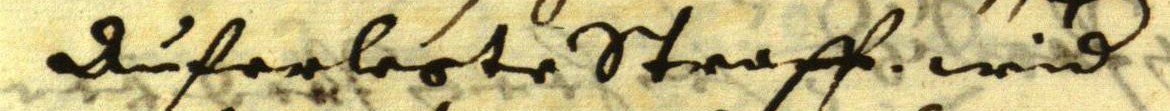Aūferlegte Straff. wid
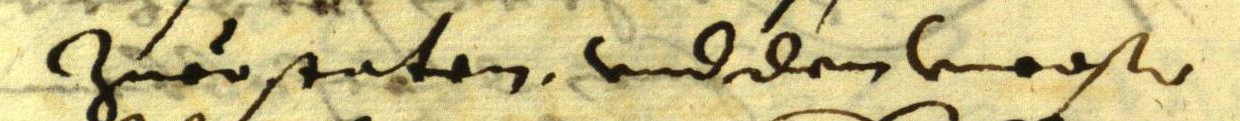Zūerstaten. vnd den vncosten
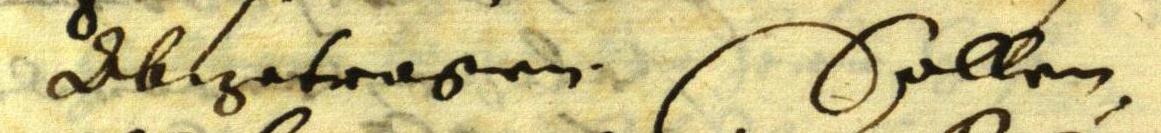Abzetragen. Sollen
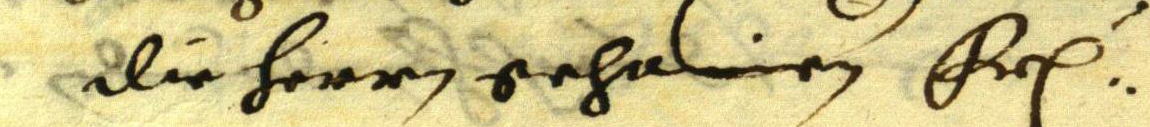die herrn gehaimen Frl:
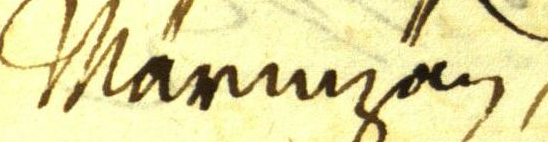Märnzän.
